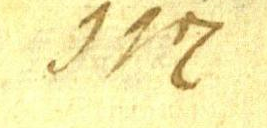117
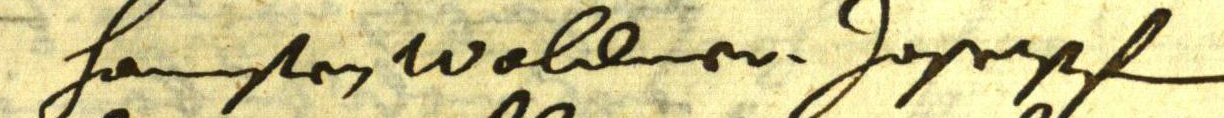hannsen Waldner. Joseff
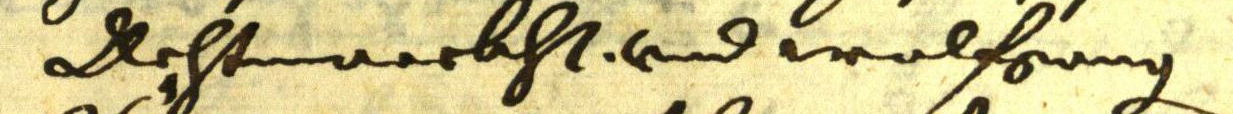Achtmarckht. vnd Wolfgang
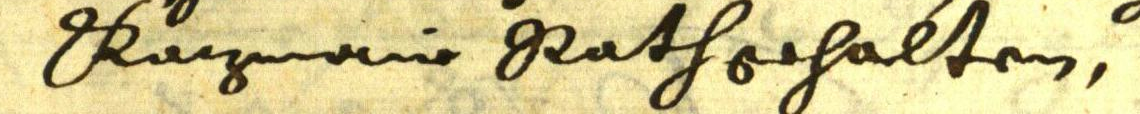Kazmair Rath gehalten,
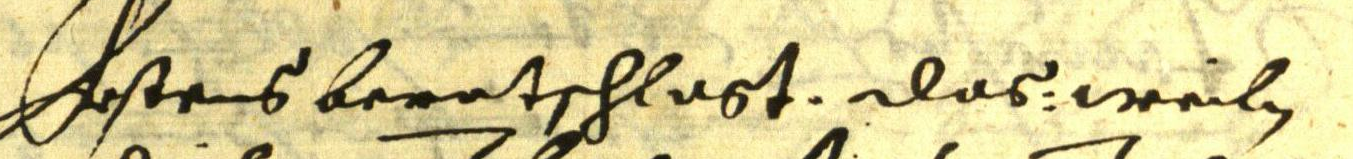Erstens beratschlagt. das: weiln
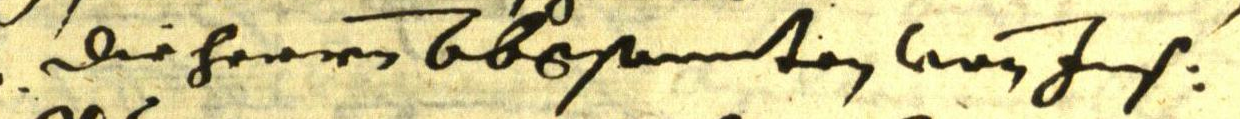die herrn Abgsannten von Ins¬
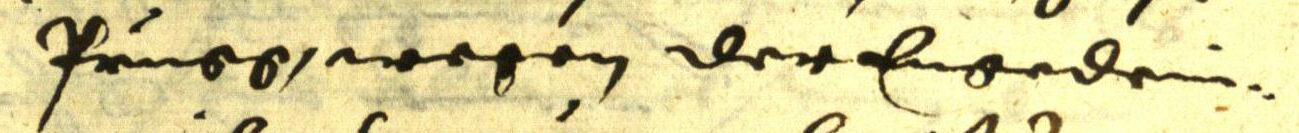Prūgg, wegen der Engedein¬
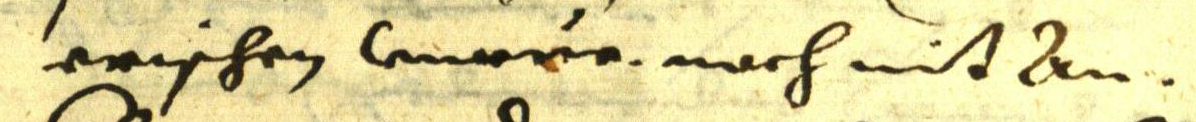erischen vnrūe. noch nit An¬
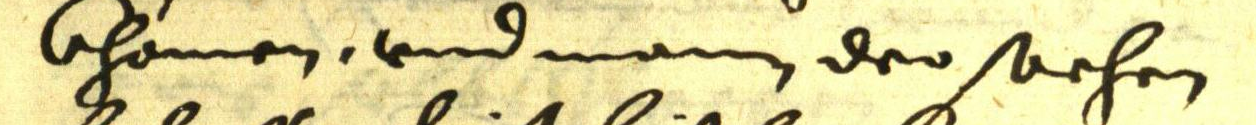khomen. vnd mann der sachen
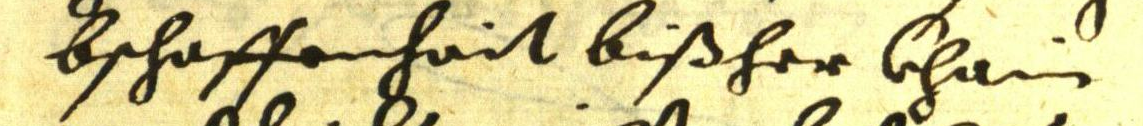bschaffenhait bißher khain
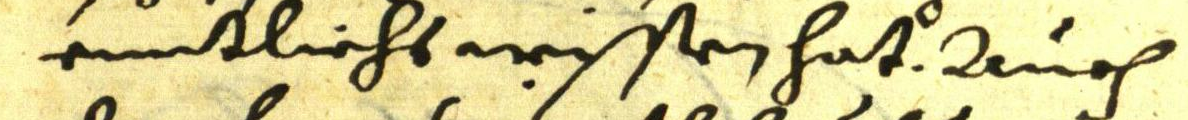enntlichs wissen hat. Aūch
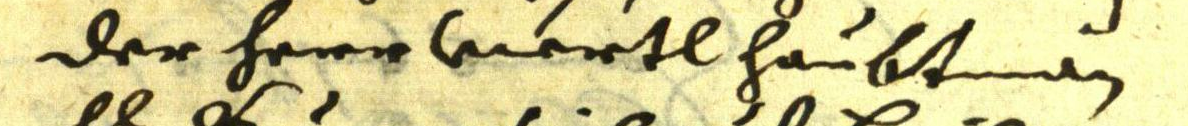der herr viertlhaūbtman
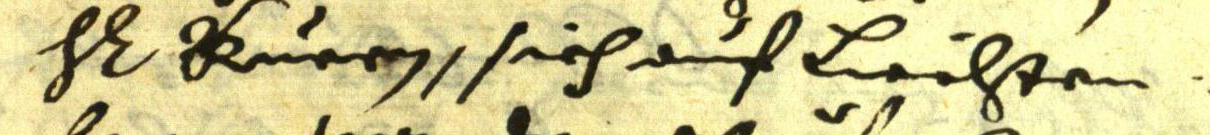hl Kūeen, sich aūf Liechten¬
